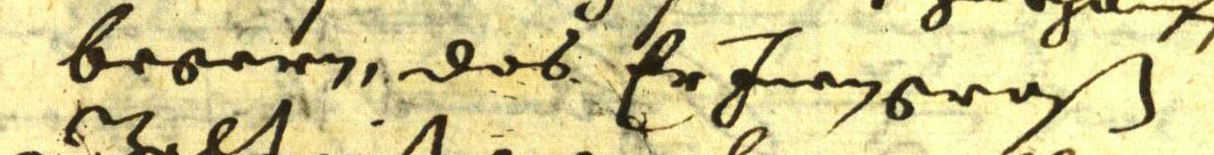begern, das Er Inen groß
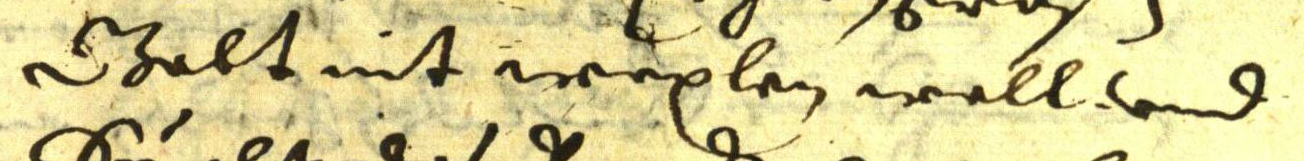Gelt nit wexlen well. vnd
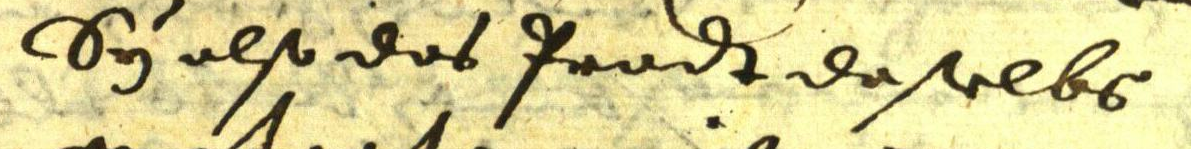Sȳ also das Prodt daselbs
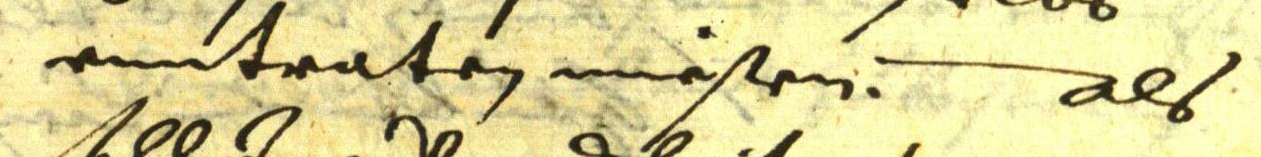enntraten miesen. Als
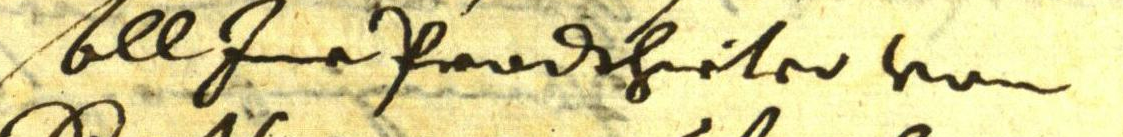soll Ime Prodthieter von
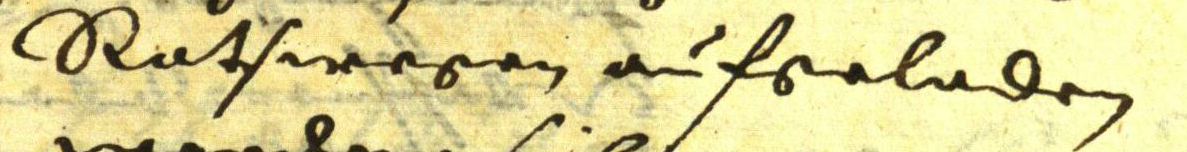Ratswegen aūfgeladen
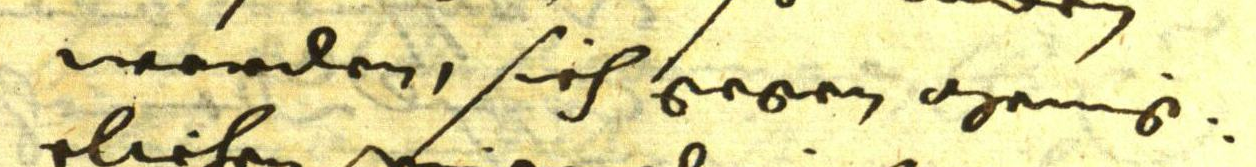werden, sich gegen Menig¬
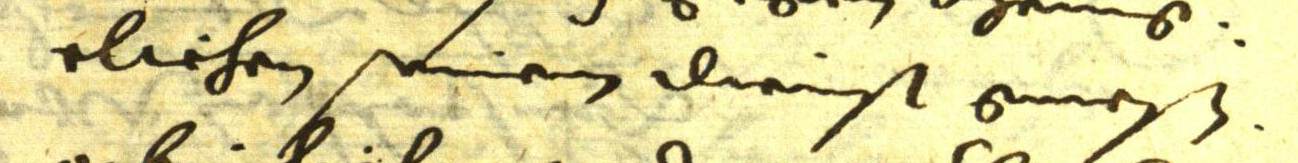elichen seinem dienst gmeß.
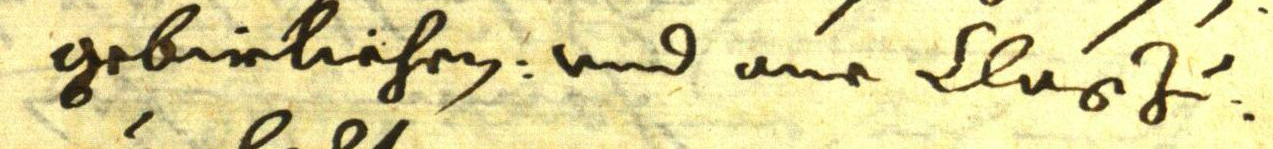gebirlichen: vnd one Clag Zū¬
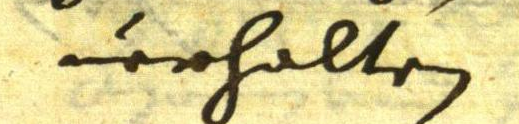ūerhalten.
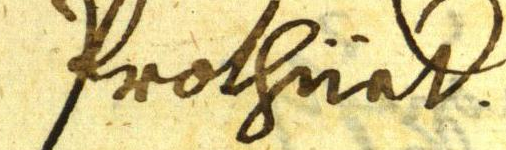Prothüet.
